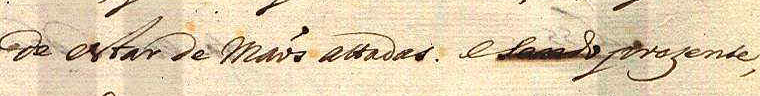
de estar de maõs attadas. E sendo prezente,
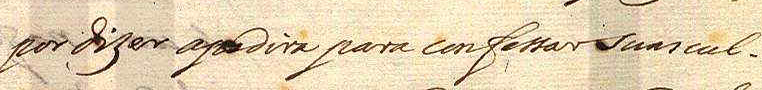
por dizer a pedira para confessar suas cul
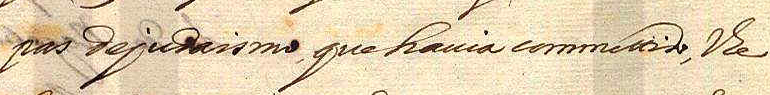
pas de judaismo, que hauia commettido, lhe
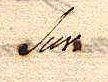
Iur
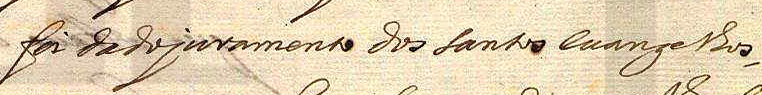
foi dado juramento dos santos euangelhos,
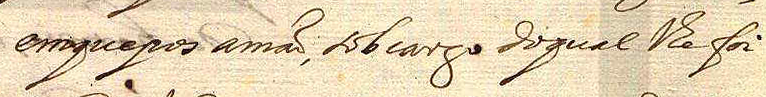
em que pos a maõ, sob cargo do qual lhe foi
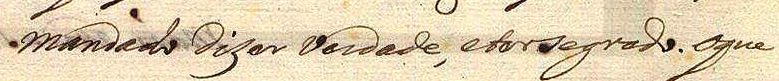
mandado dizer verdade, e ter segredo o que
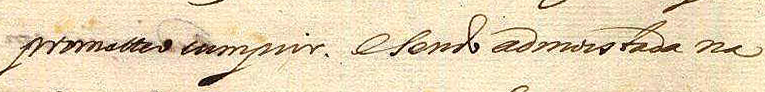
prometteo cumprir. E sendo admoestada na
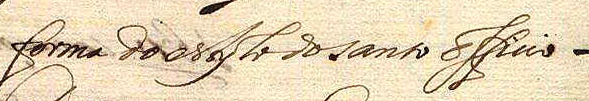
forma do estylo do santo officio
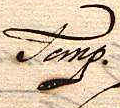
Temp.
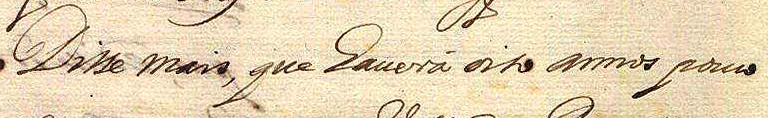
Disse mais, que hauerá oito annos pouco
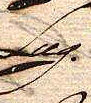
Lug.
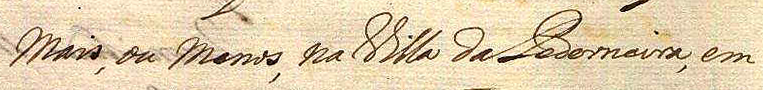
mais, ou menos, na Villa da Pederneira, em
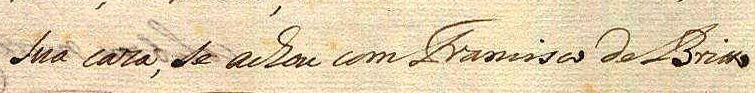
sua caza, se achou com Francisco de Britto
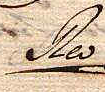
Reo
